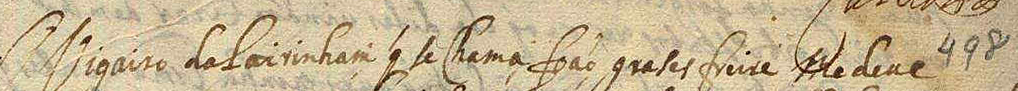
O Vigairo da Loirinham q̄ se Chama foaõ grases freire lhe deue
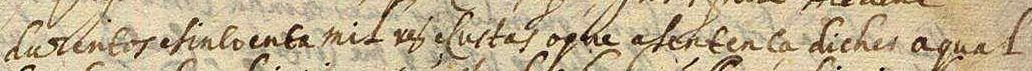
duzentos e sincoenta miL res̄ e Custas o que a sentença dicher a qual
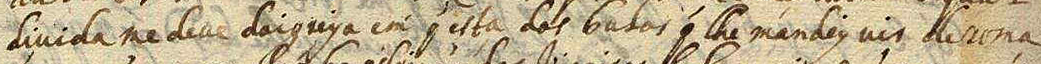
diuida me deue da igreya em q̄ esta dos bulos q̄ lhe mandey uir de roma,
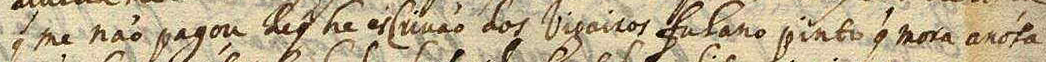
q̄ me naõ pagou de q̄ he esCriuaõ dos Vigairos fulano pinto q̄ mora a nosa
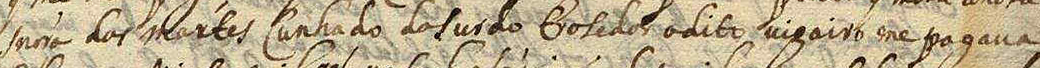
snorā dos martes Cunhado do surdo trosedor o dito uigairo me pagaua
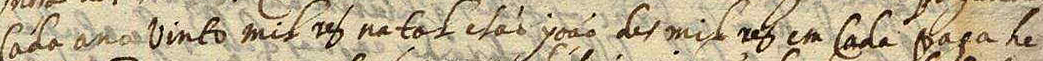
Cada ano vinto mil res̄ nataL e saõ yoaõ des mil res̄ em Cada paga he
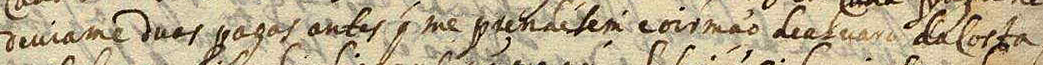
deuiame duas pagas antes q̄ me prendésem e o irmaõ de aluaro da Costa
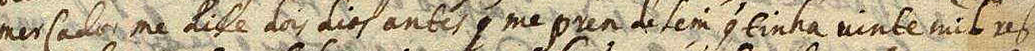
merCador me dise dois dias antes q̄ me prendesem, q̄ tinha uinte miL res̄
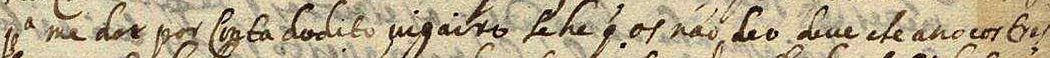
pa me dar por Conta do dito uigairo se he q̄ os não deo deue ese ano e os tres
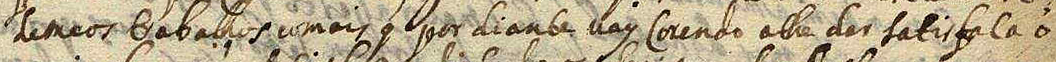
de meos trabalhos e o mais q̄ por diante uay Corendo a lhe dar satisfaCaõ
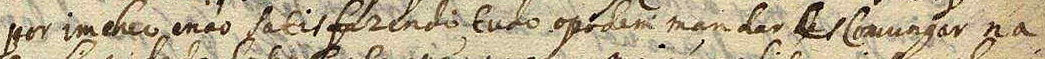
por imcher e naõ satisfazendo tudo o podem mandar EsComungar na
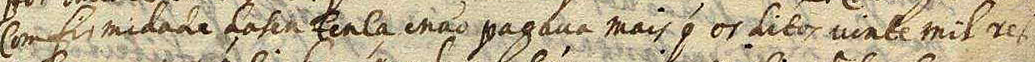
Comfirmidade da sentenÇa e naõ pagaua mais q̄ os ditos uinte mil res̄
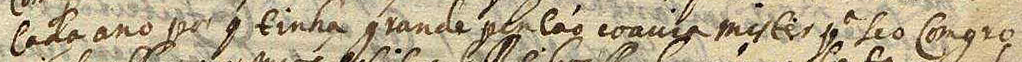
Cada ano porq̄ tinha grande penCaõ e o auia mister pa seo Comgro
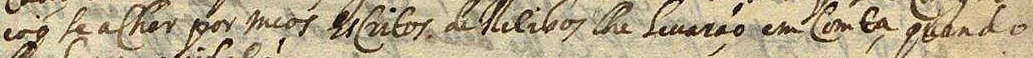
e o q̄ se aChar por meos EsCritos de ReCibos lhe Leuarao em Comta quando
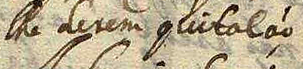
lhe derem quitaCaõ
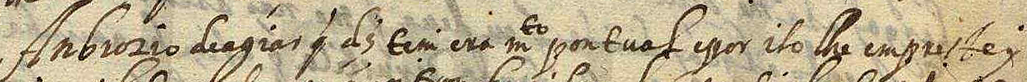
Anbrozio de agiar q̄ ds̄ tem era mto pontuaL e por iso lhe emprestey
